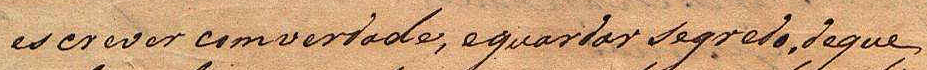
escrever com verdade, e guardar segredo, de que
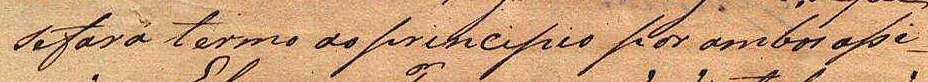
se fará termo ao principio por ambos assi
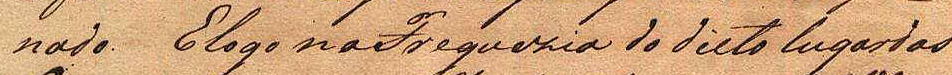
nado. E logo na Freguezia do dicto lugar das
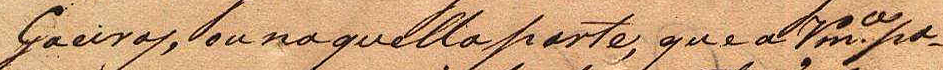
Gaeiras, ou naquella parte, que a Vm.ce pa
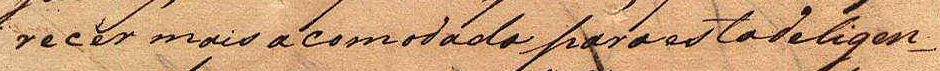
recer mais acomodada para esta deligen
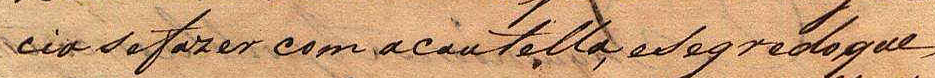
cia se fazer com a cautella, e segredo, que
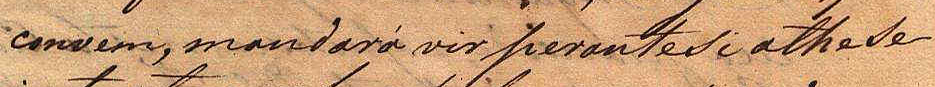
convem, mandará vir perante si athe se
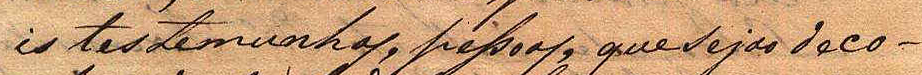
is testemunhas, pessoas, que sejao de co
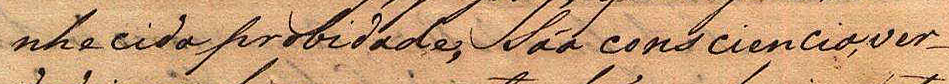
nhecida probidade, Sãa consciencia, ver
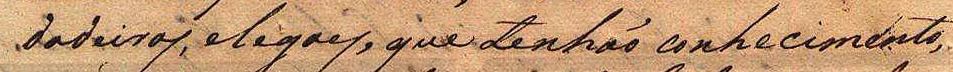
dadeiras, e legaes, que tenhaõ conhecimento,
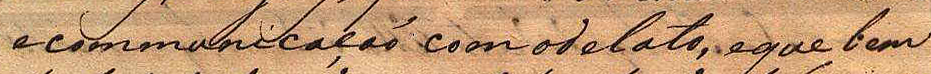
e communicaçaõ com o delato, e que bem
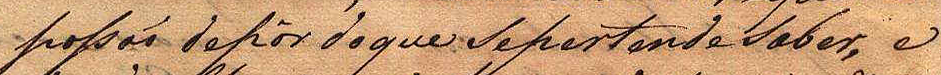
possaõ depôr do que se pertende saber, e
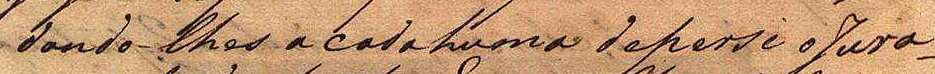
dando-lhes a cada huma de per si o Jura
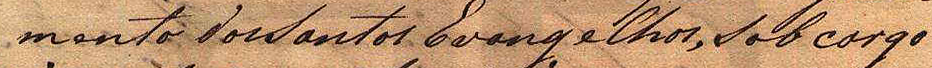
mento dos Santos Evangelhos, sob cargo
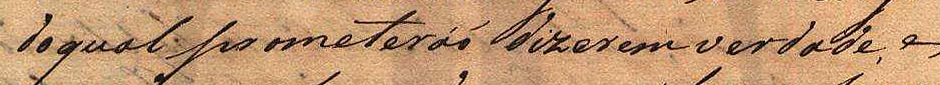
do qual prometeraõ dizerem verdade, e
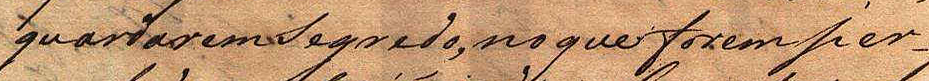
guardarem Segredo, no que forem per
